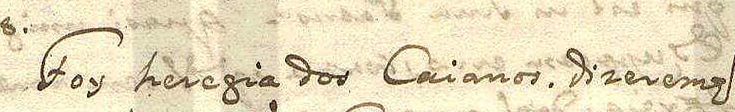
Foy heregia dos Caianos, dizerem q̄
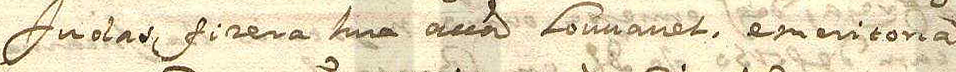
Judas fizera hua acçaõ Louuauel, e meritoria
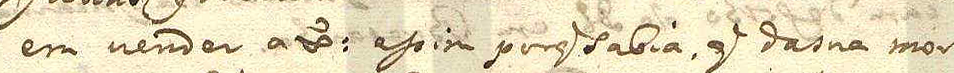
em uender a xo: assim porq̄ sabia, q̄ da sua mor
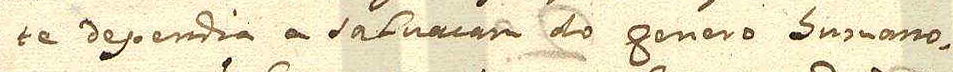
te dependia a saluaçam do genero humano,
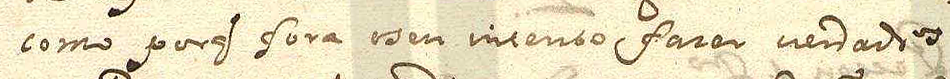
como porq̄ fora o seu intento fazer uerdadros
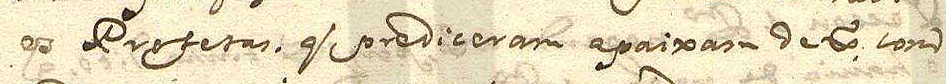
os Profetas. q̄ prediceram a paixam de xo. com
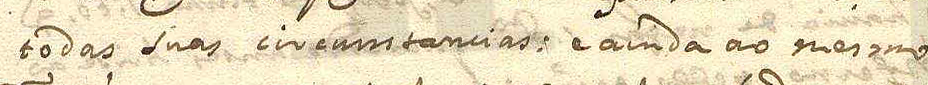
todas suas circunstancias: e ainda ao mesmo
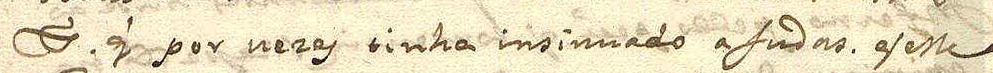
§ q̄ por uezes tinha insinuado a Judas. a elle
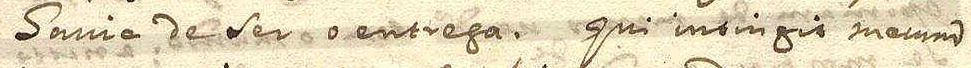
hauia de ser o entrega. qui intingit mecum
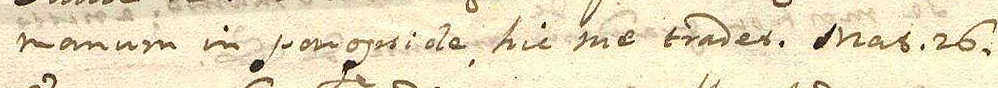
manum in paropside, hic me trader. mat. 26.
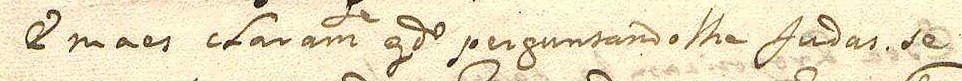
E maes claramte qdo perguntandolhe Judas se
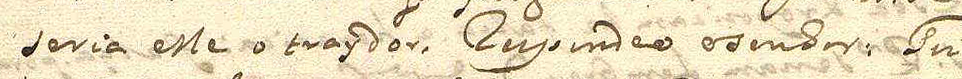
seria elle o traydor. Respondeo o senhor: Tir
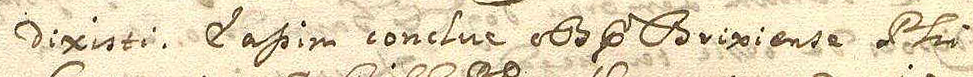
dixisti. E assim conclue o Bpo Brixiense Phi
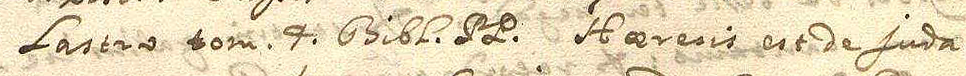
Lastro tom. 4. Bibl. PP. Hæresis est de Juda
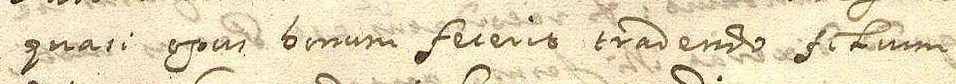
quasi opus bonum feceris tradendo fiLium
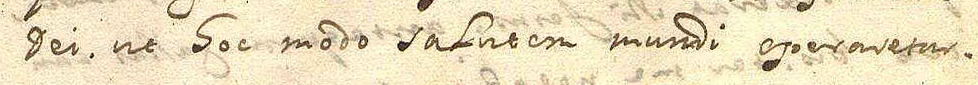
Dei. ut hoc modo saLutem mundi operaretur.
